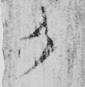人
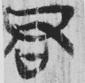君
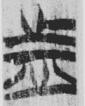者
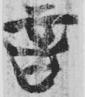言
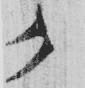人
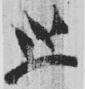之
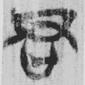君
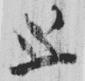之
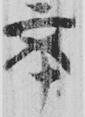不
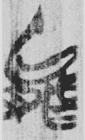能
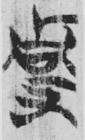○（使）
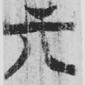亓（其）
